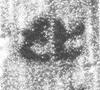心
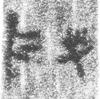母
